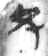丑
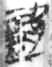○（陷）
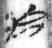於
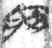寅
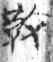○（破）
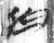於
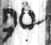卯
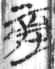坪（平）
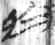於
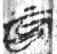晨
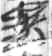寍（寧）
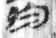於
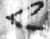巳
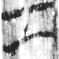工（空）
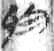於
